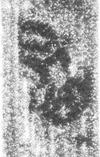{金臽}
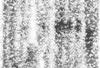一
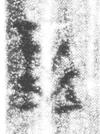鉉
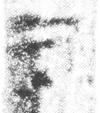亓（其）
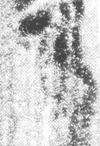木
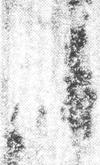器
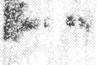一
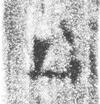○（俎）
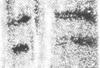二
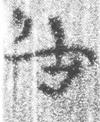居
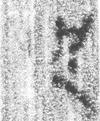喿
